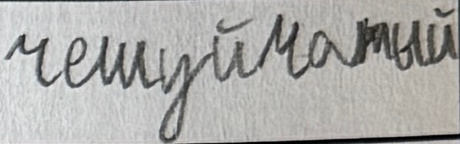чешуйчатый
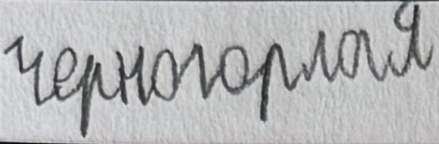черногорлая
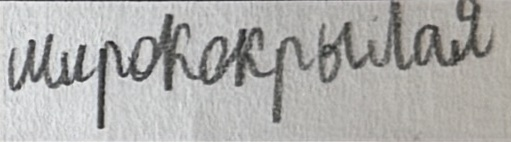ширококрылая
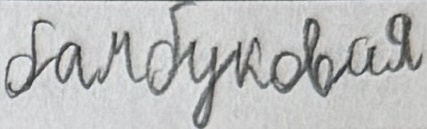бамбуковая
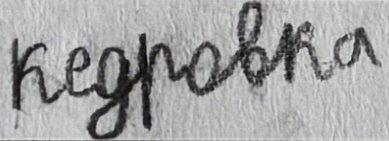кедровка
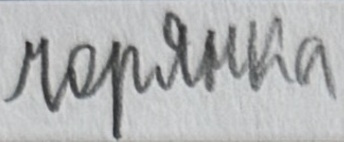морянка
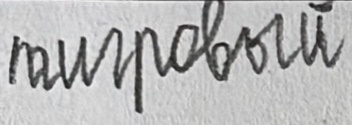тигровый
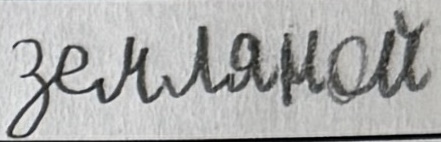земляной
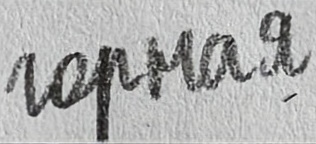горная
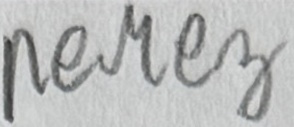ремез
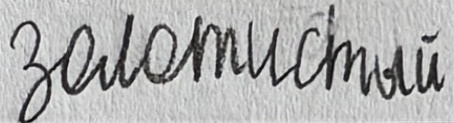золотистый
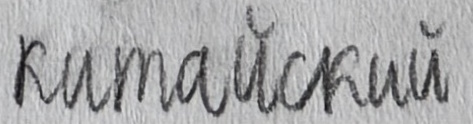китайский
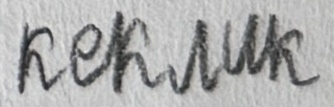кеклик
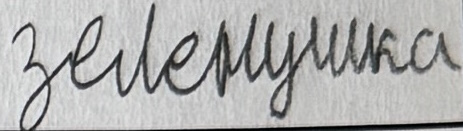зеленушка
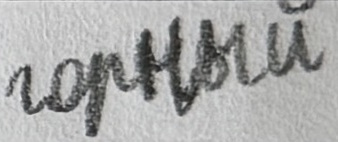горный
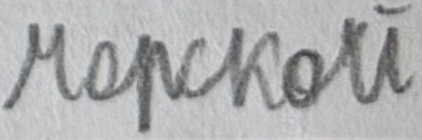морской
